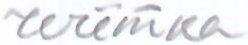чечётка
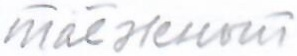таёжный
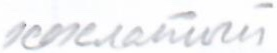хохлатый
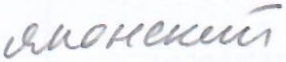японский
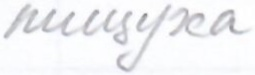пищуха
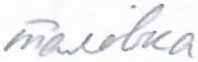таловка
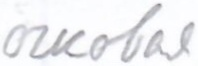очковая
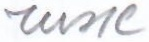чиж
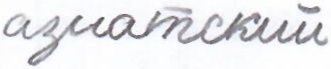азиатский
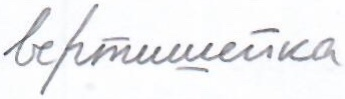вертишейка
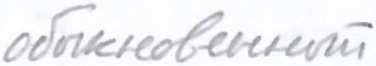обыкновенный
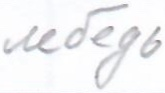лебедь
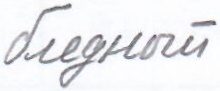бледный
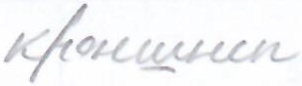кроншнеп
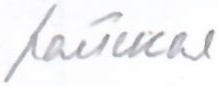райская
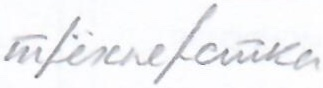трёхперстка
